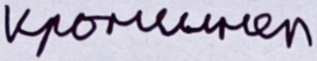кроншнеп
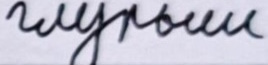глупыш
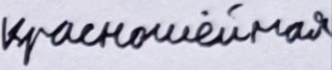красношейная
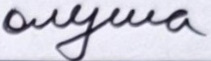олуша
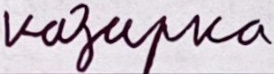казирка
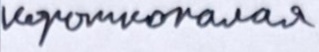короткопалая
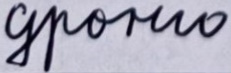дронго
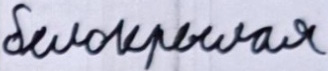белокрылая
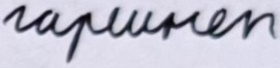гаршнеп
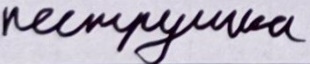пеструшка
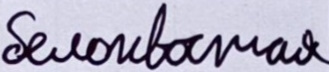белохвостая
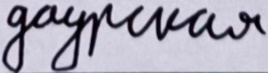даурская
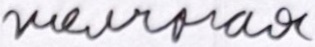желчная
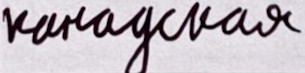канадская
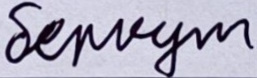беркут
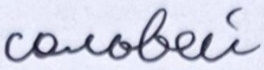соловей
